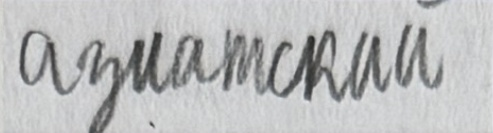азиатский
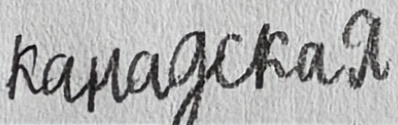канадская
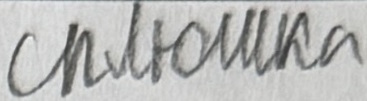сплюшка
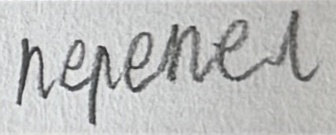перепел
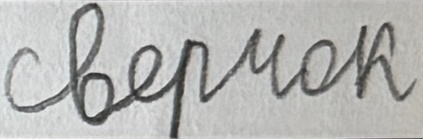сверчок
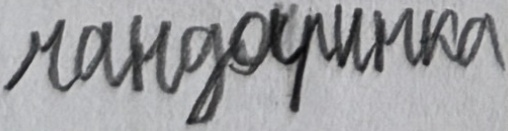мандаринка
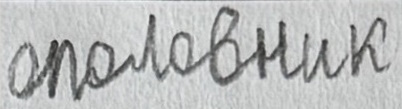ополовник
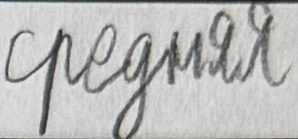средняя
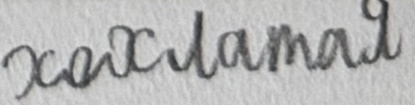хохлатая
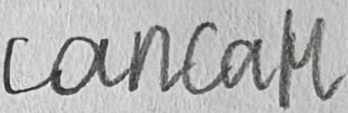сапсан
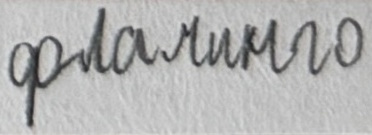фламинго
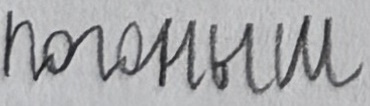погоныш
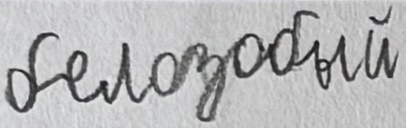белозобый
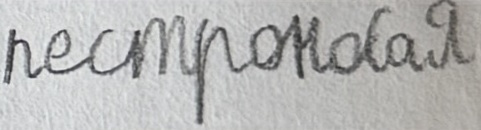пестроносая
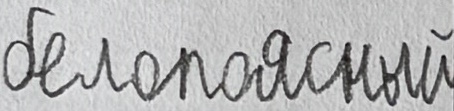белопоясный
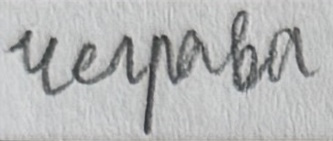чеграва
